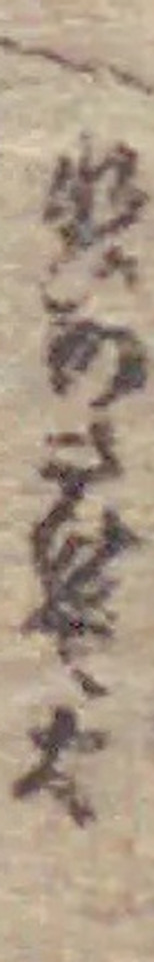れいのさけて大
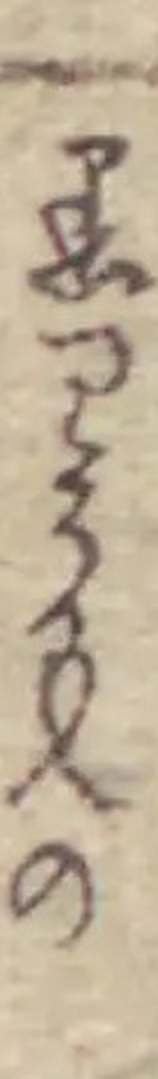黒りうもんの
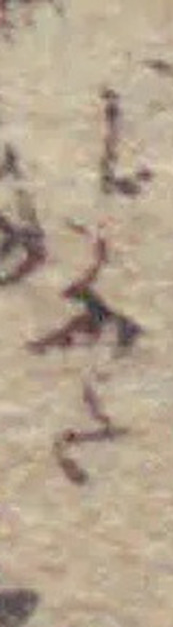しにた
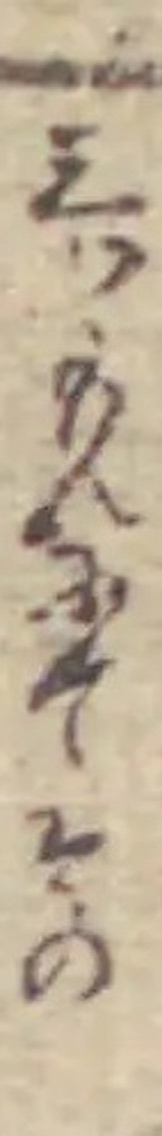三つもんにてその
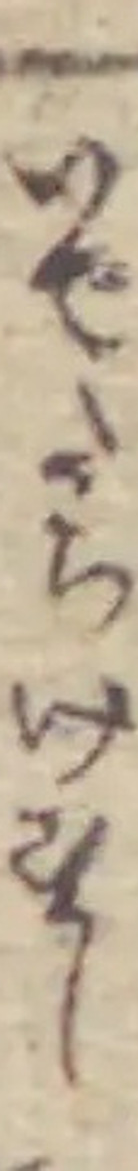いでたちけすし
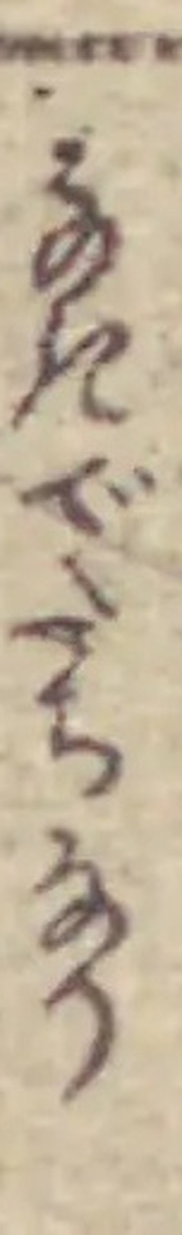なきでたちなり
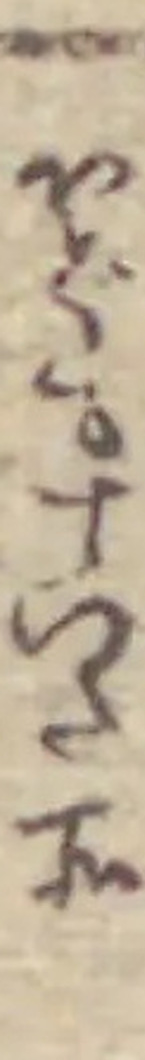ほどもすいた所
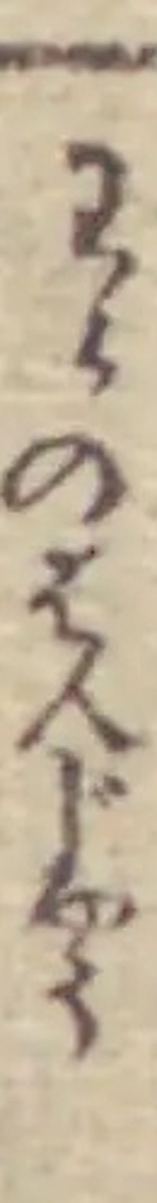わらのはんじやう
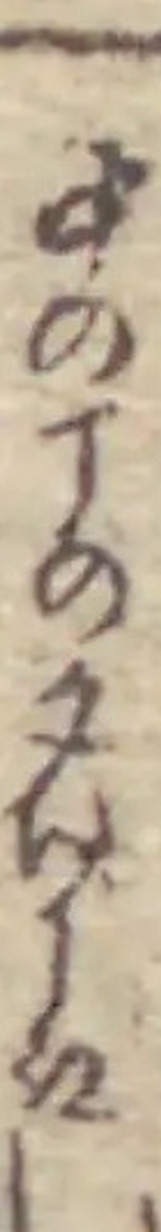中の丁の夕けしき
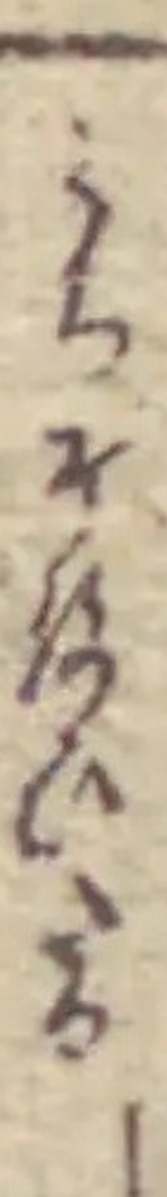うちそろひたる
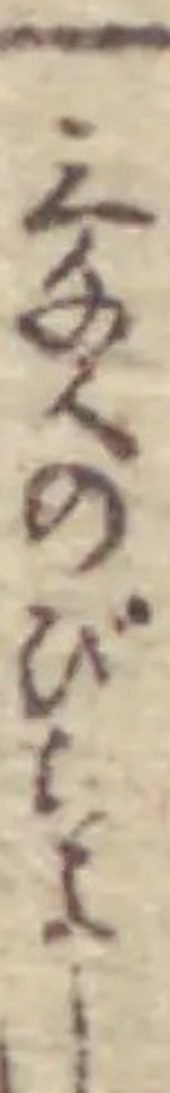三千人のびちよ
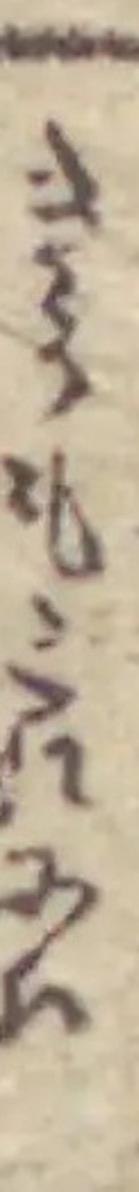きうもこれには
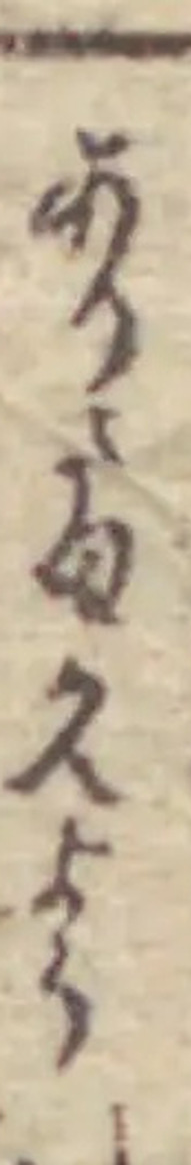ありさまかんよう
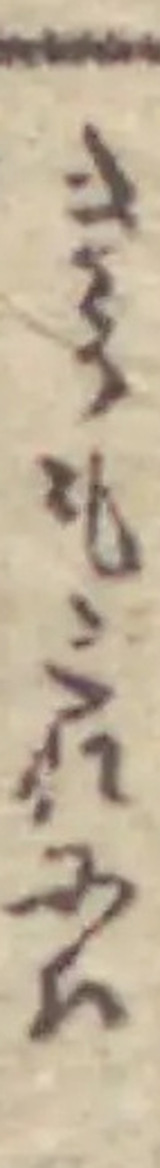きうもこれには
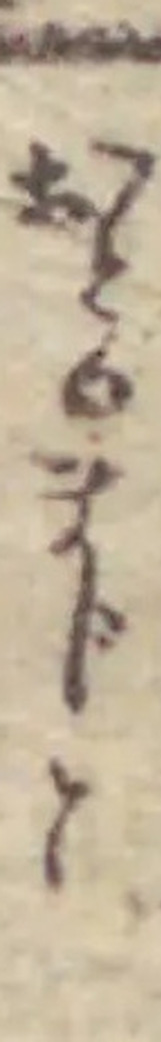おとるまじと
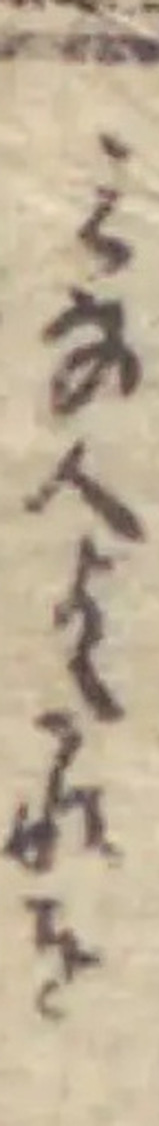みな人よたれを
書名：夜野中狐物 2巻
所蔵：国立国会図書館 National Diet Library, JAPAN
